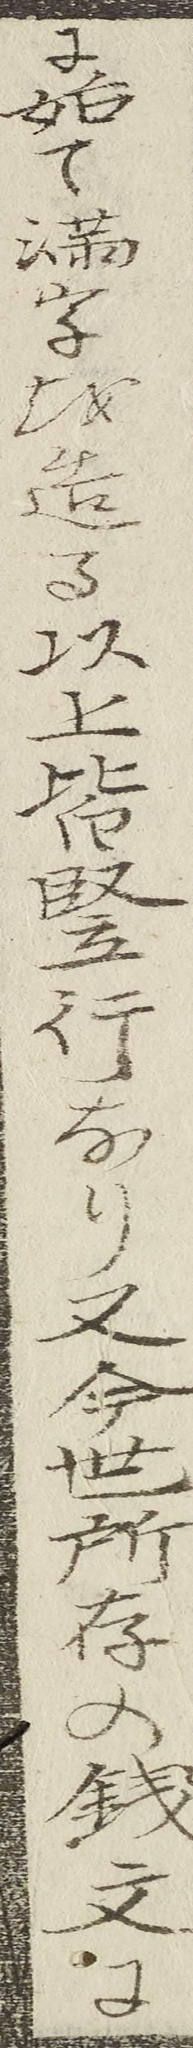に始て満字を造る以上皆竪行なり又今世所存の銭文に
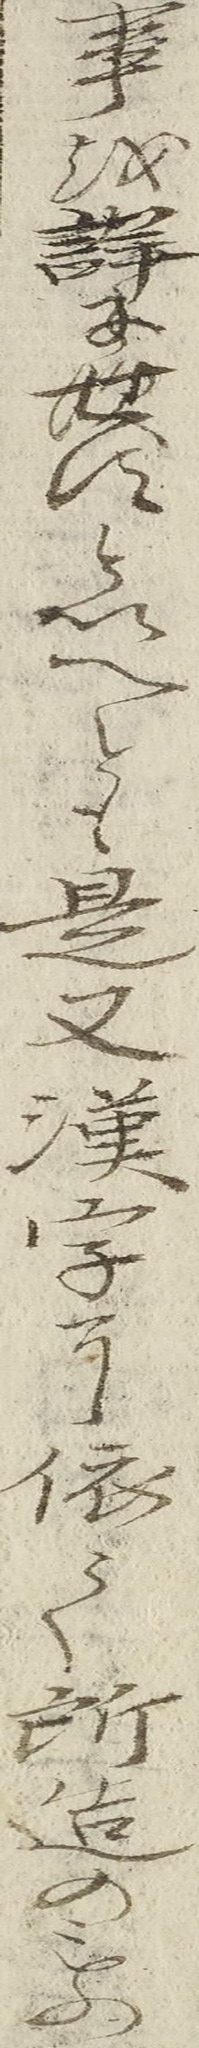事を詳にせすといへとも是又漢字に依て所造のもの
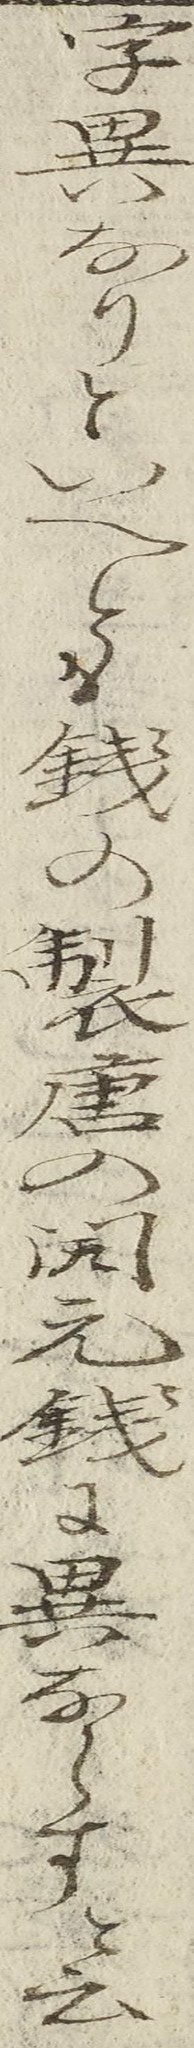字異なりといへとも銭の製唐の開元銭に異ならすと云
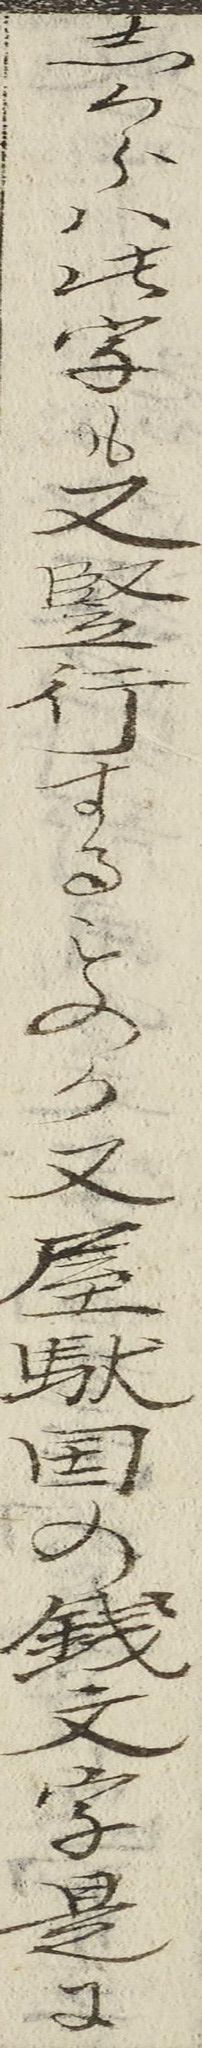しからハ此字も又竪行するものか又屋駄国の銭文字是に
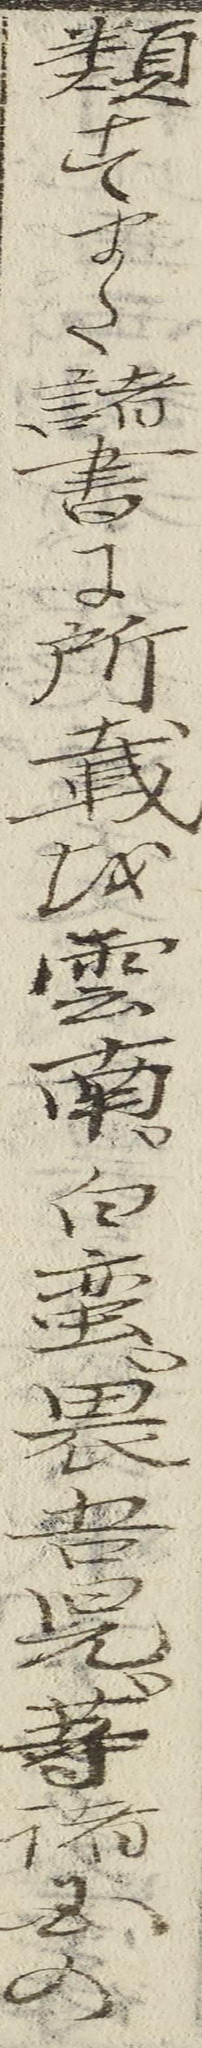類すまた諸書に所載を雲南。白蛮。畏吾児。等諸国の
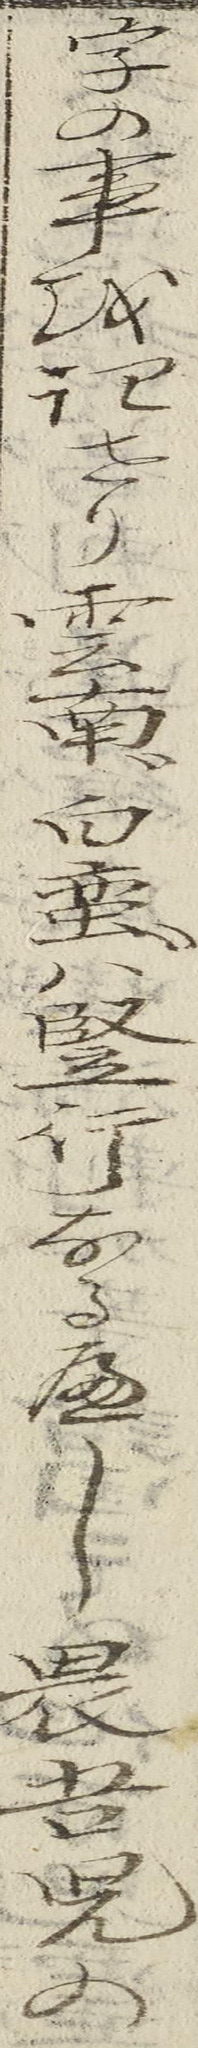字の事を記せり雲南白蛮ハ堅行なるべし是吾児の
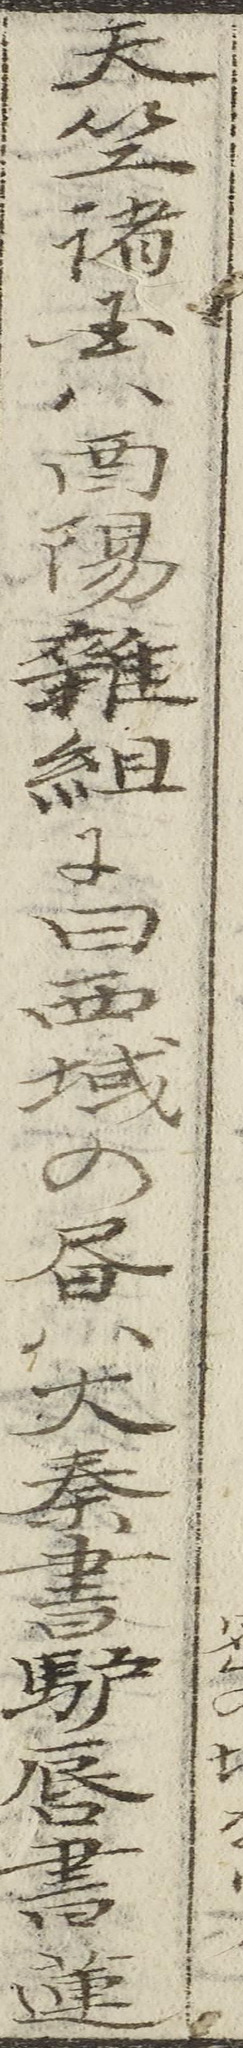天竺諸国ハ西陽雑組に曰西域の書ハ大奏書駅唇書蓮
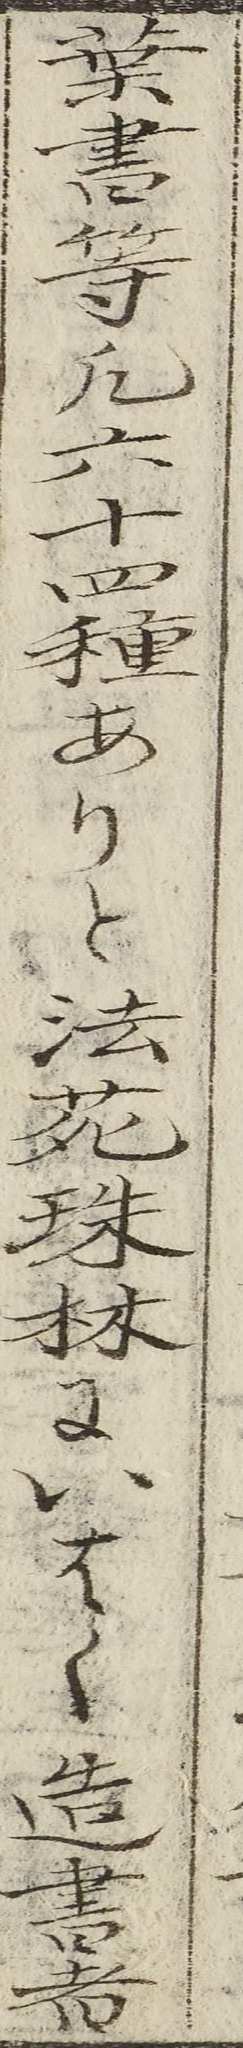葉書等凡そ六十四種ありと法苑珠リンにいはく造書者
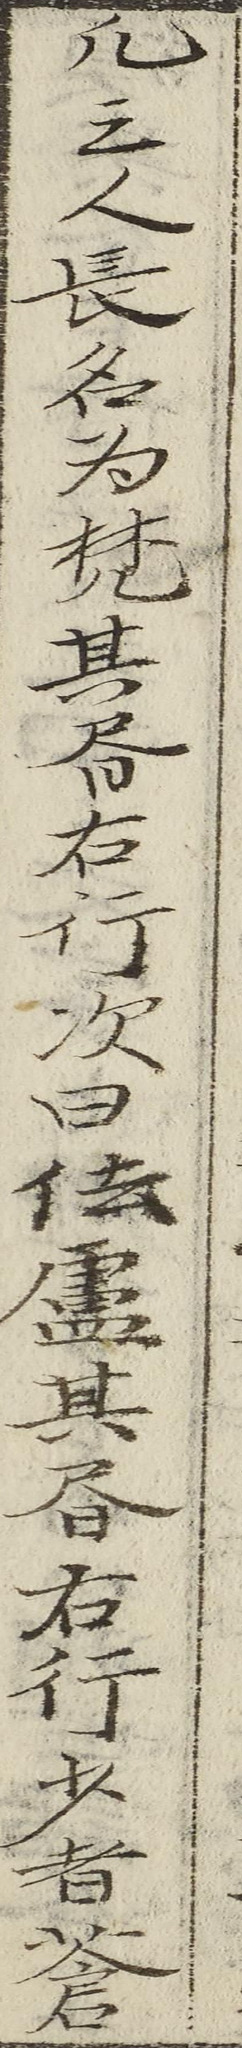凡三人長名為梵其書右行次曰佉盧其書右行少者蒼

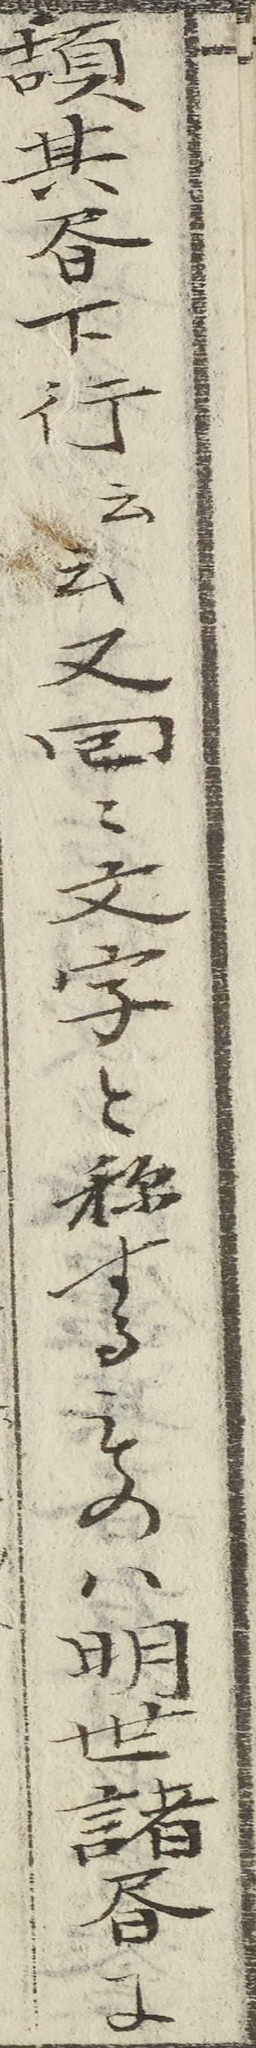頡其書下行云云又回々文字と称するものハ明世諸書に
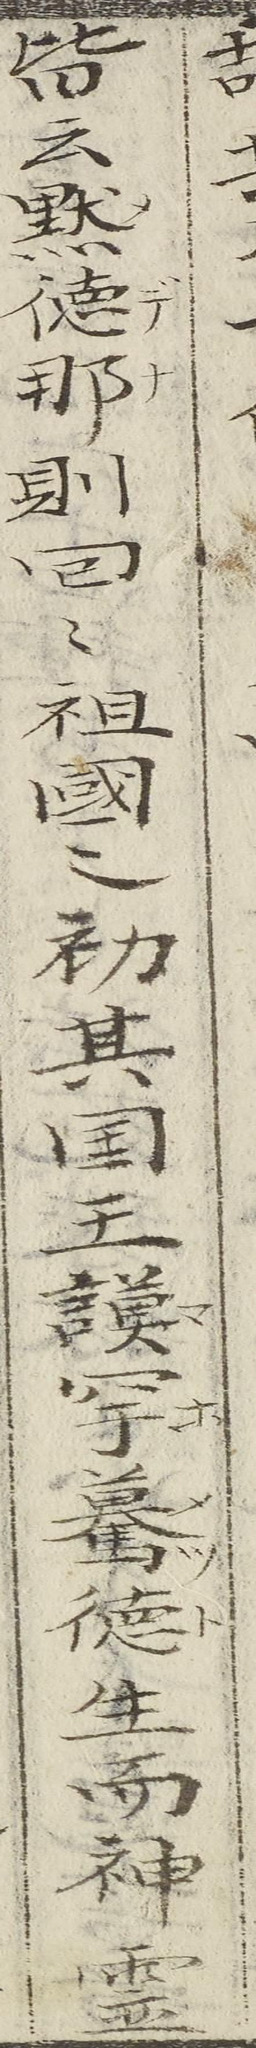皆云黙徳那則回々祖国也初其国王謨罕驀徳生而神霊
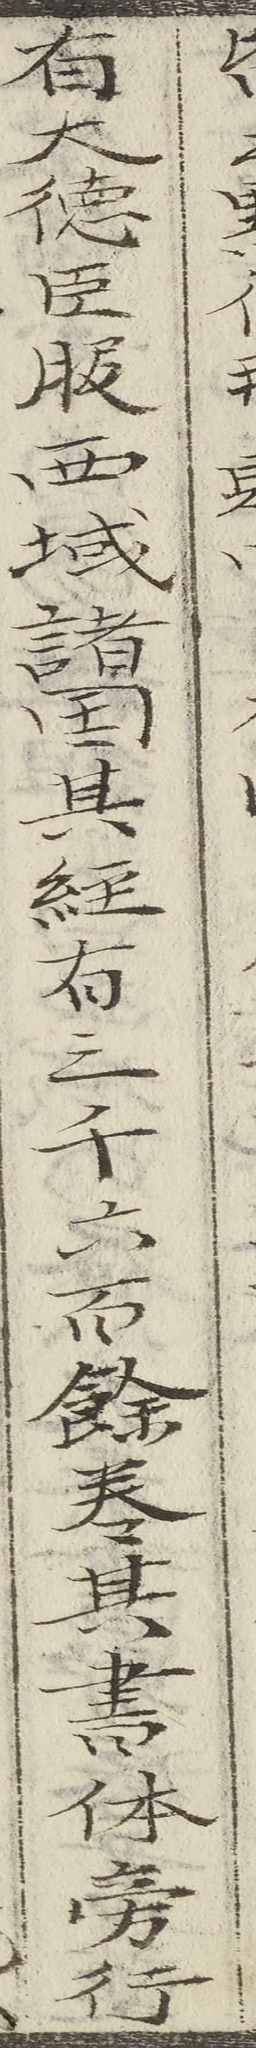有大徳臣服西域諸国其の経有三千六百余巻其書体旁行
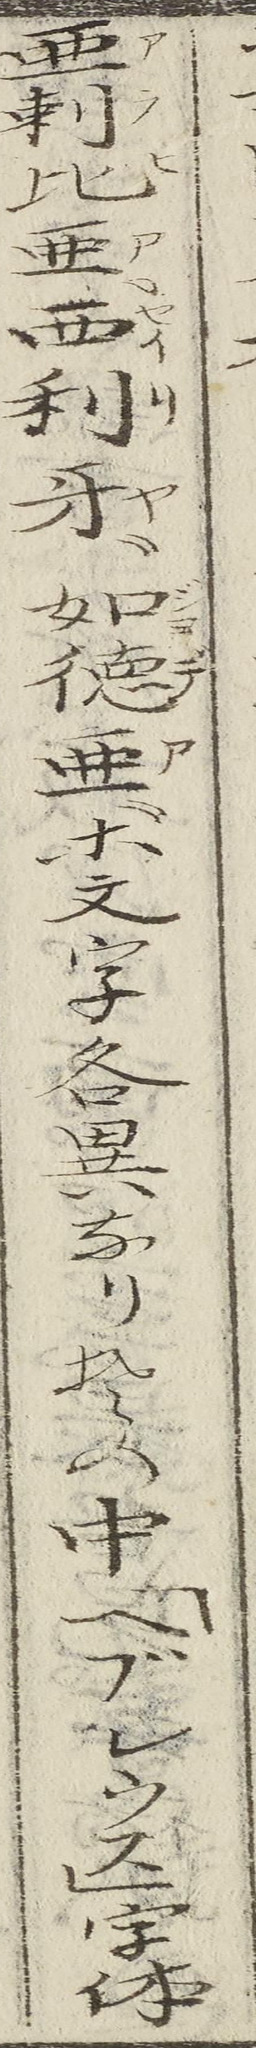亜刺比亜〃西利牙〃如徳亜〃等文字各異なりその中「ㇸブレウス」字体
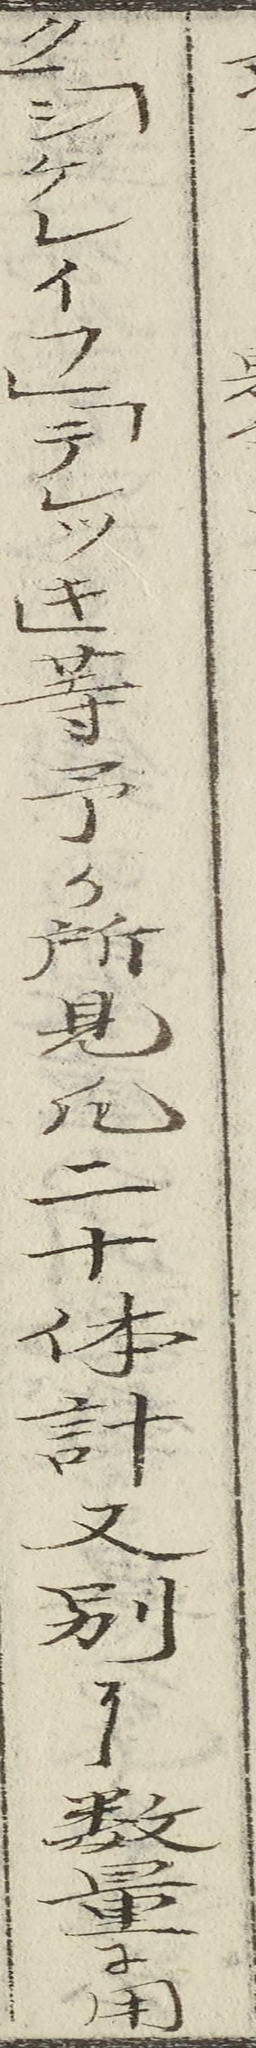ク」「シケレイフ」「テレツキ」等予か所見凡二十体計又別に数量に用
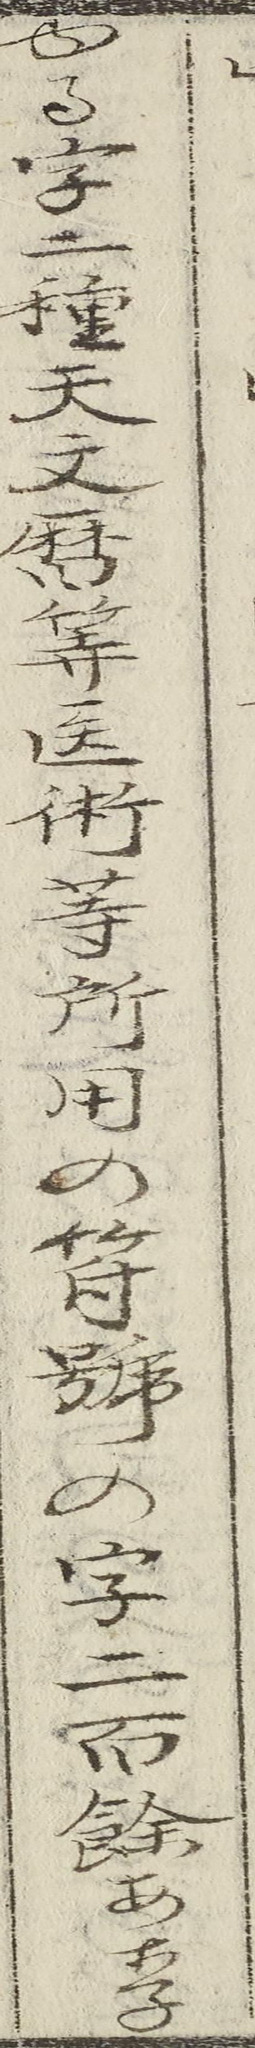ゆる字二朱天文歴等医術等所用の符号の字二而余あり
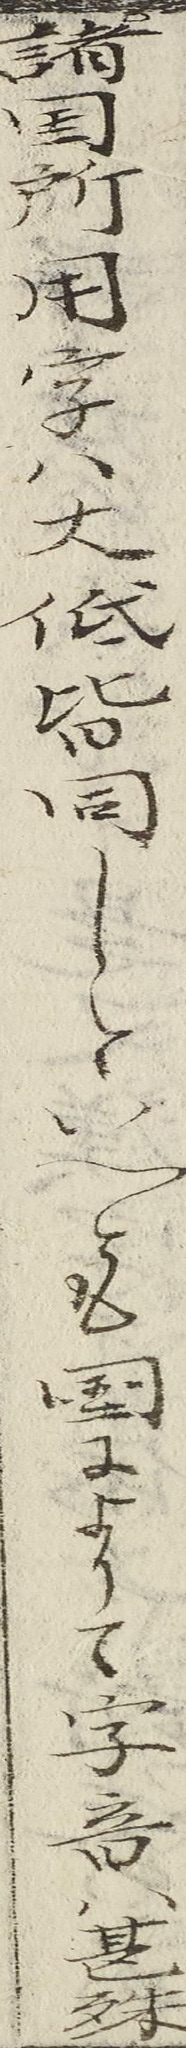諸国所用字ハ大低皆同しといへとも国によりて字音ハ甚殊
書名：西洋雜記　坤
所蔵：東京大学地震研究所図書室 Earthquake Research Institute Library, The University of Tokyo, JAPAN
